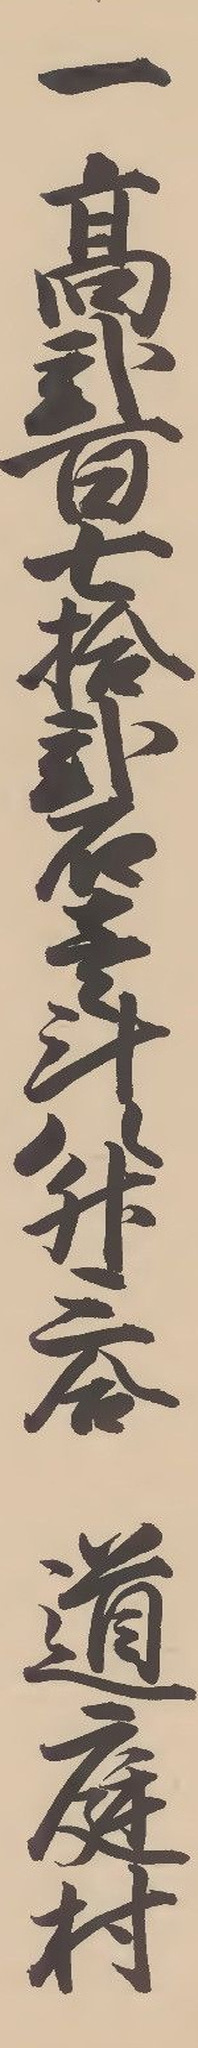一高弐百七拾弐石壱斗八升二合道庭村
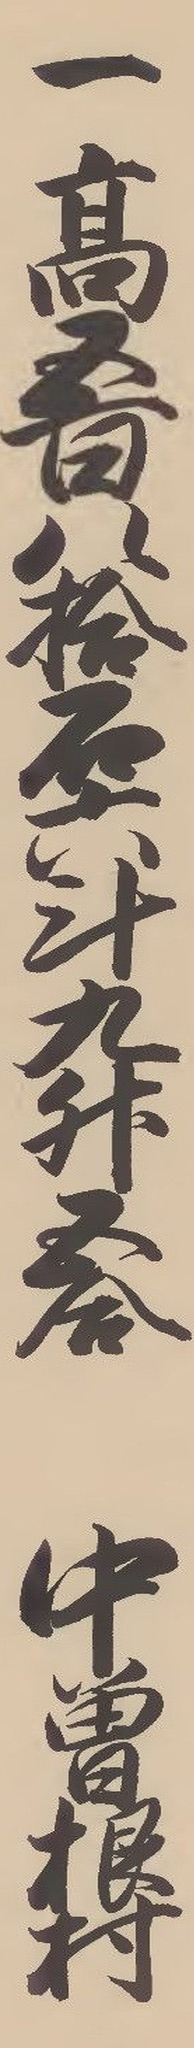一高五百八拾石六斗九升五合中曽根村
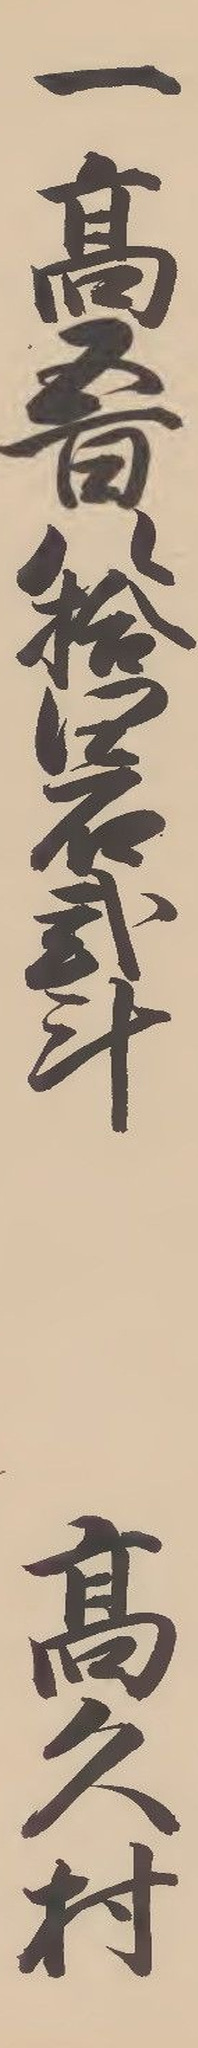一高五百八拾四石弐斗高久村
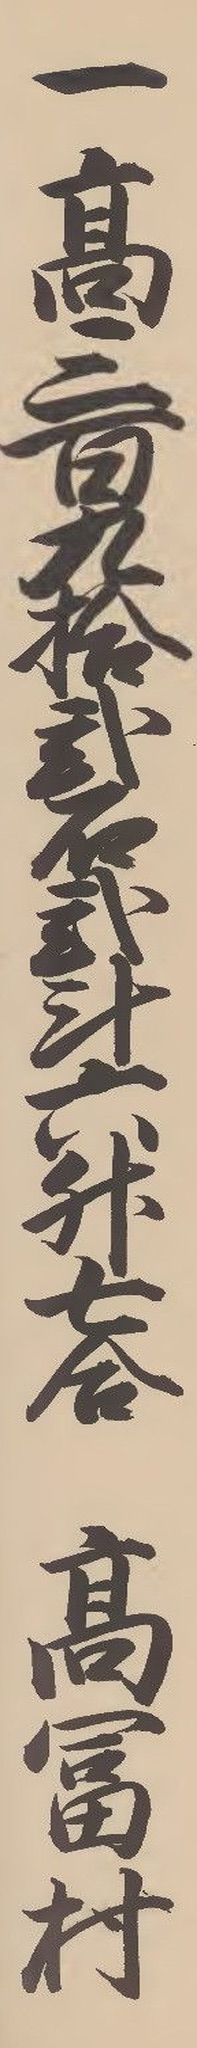一高三百九拾弐石弐斗六升七合高冨村
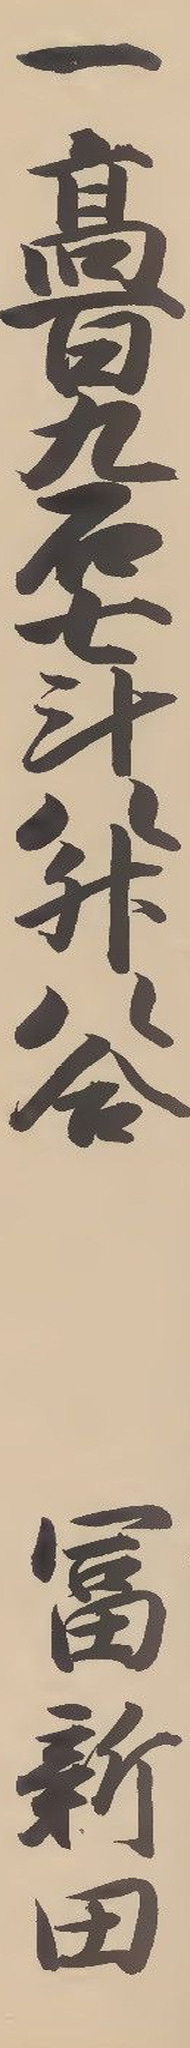一高百九石七斗八升八合冨新田
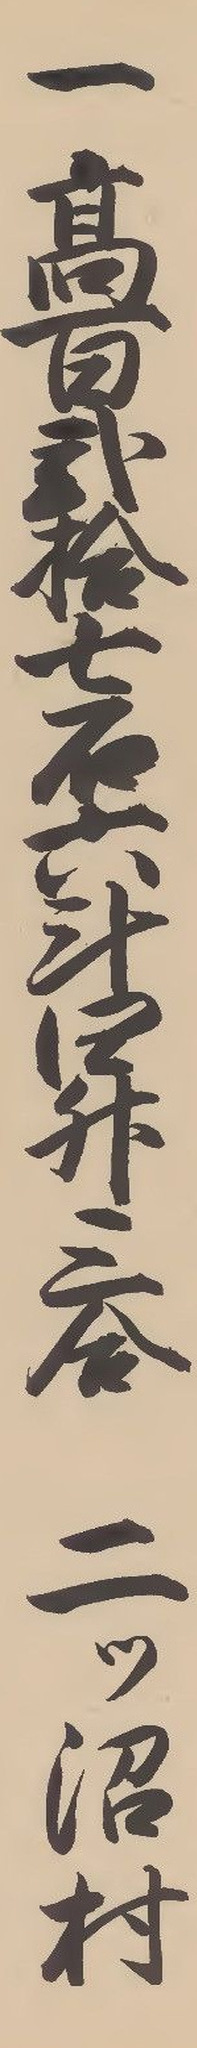一高百弐拾七石六斗四升三合二ッ沼村
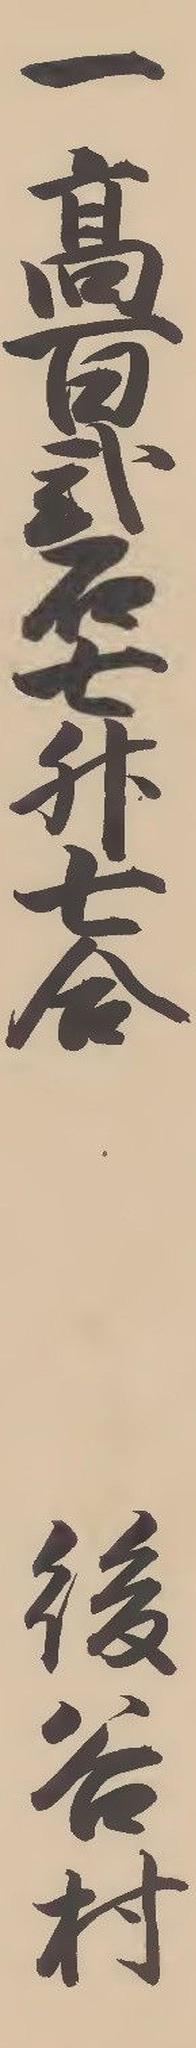一高百弐石七升七合後谷村
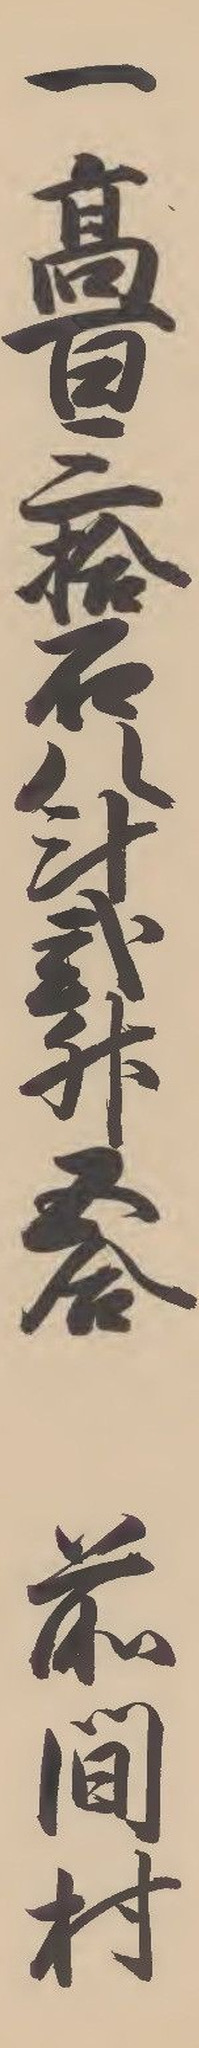一高百三拾石八斗弐升五合前間村

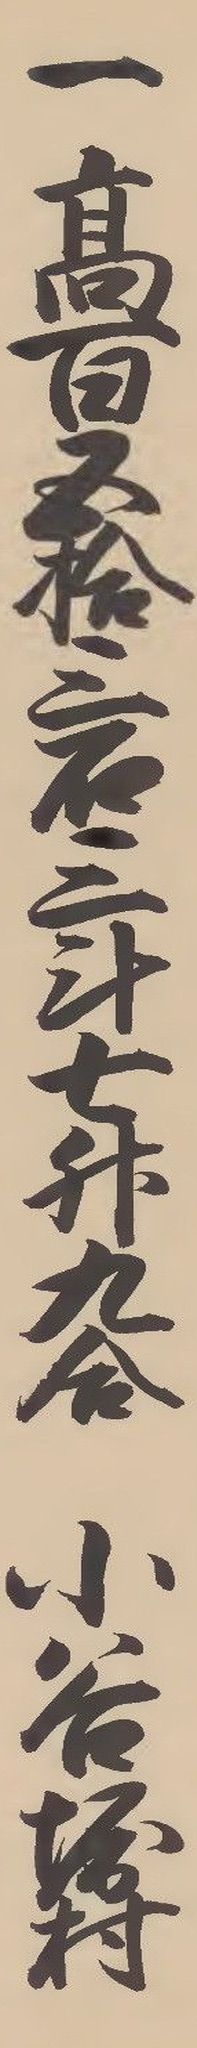一高百五拾三石三斗七升九合小谷堀村
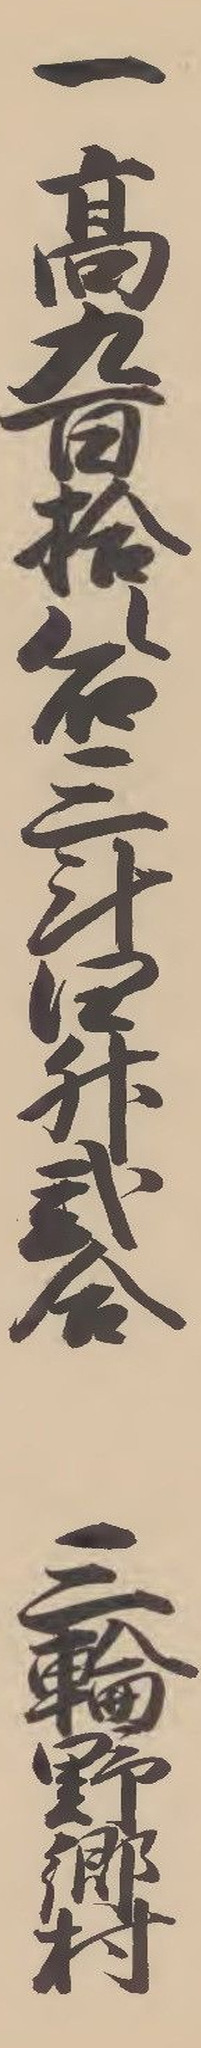一高九百拾八石三斗四升弐合三輪野郷村
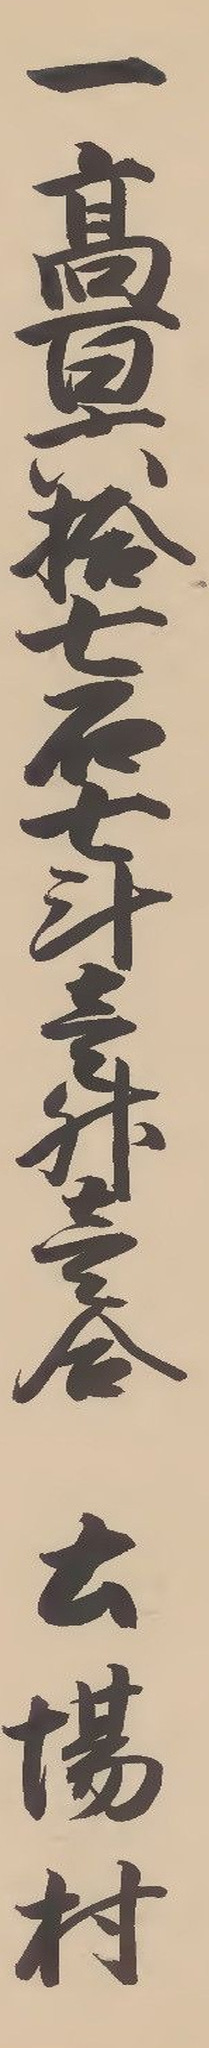一高百六拾七石七斗壱升壱合土場村
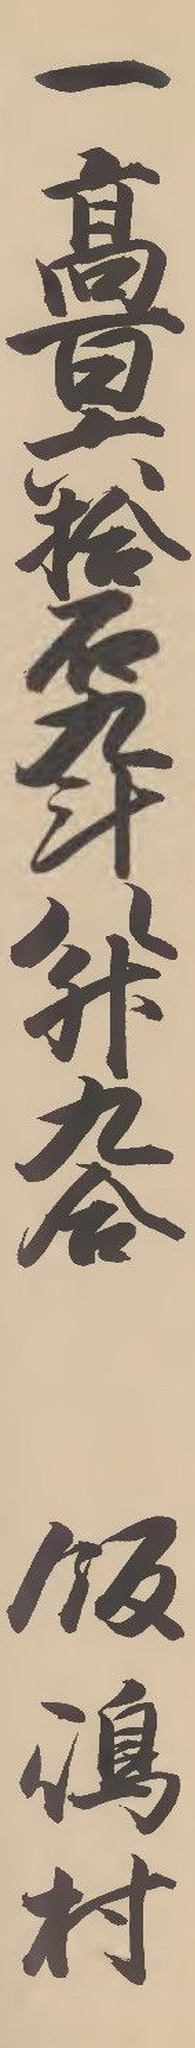一高百六拾石九斗八升九合飯嶋村
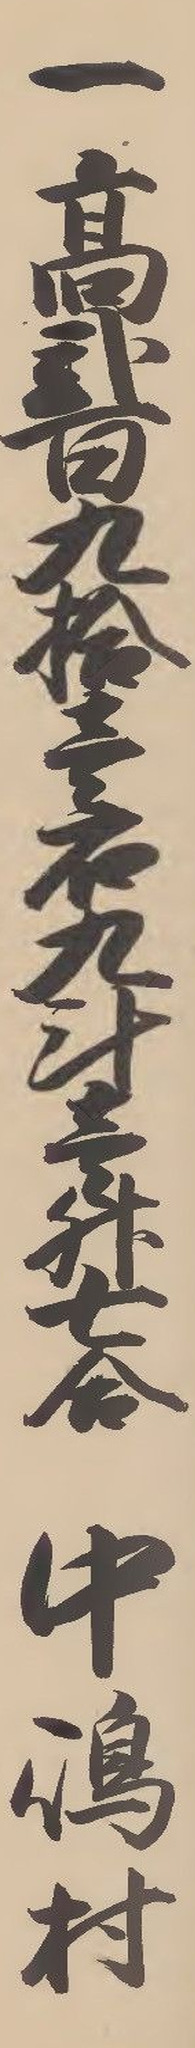一高弐百九拾壱石九斗壱升七合中嶋村
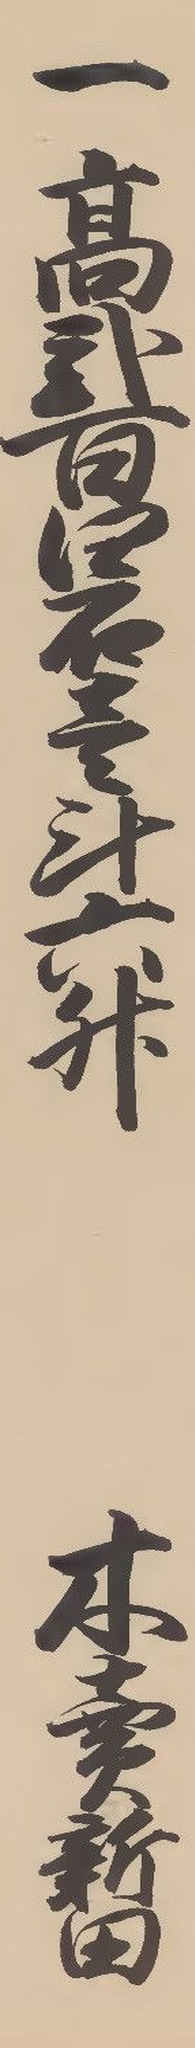一高弐百四石壱斗六升木売新田
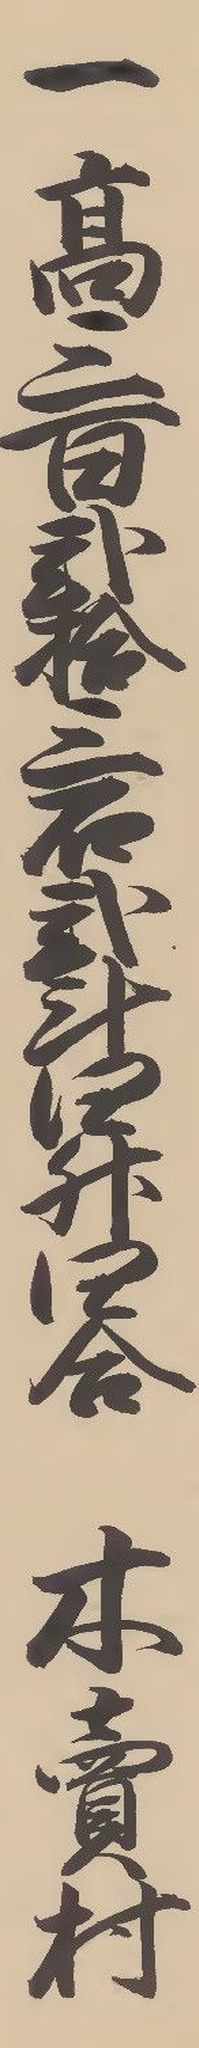一高三百弐拾三石弐斗四升四合木売村
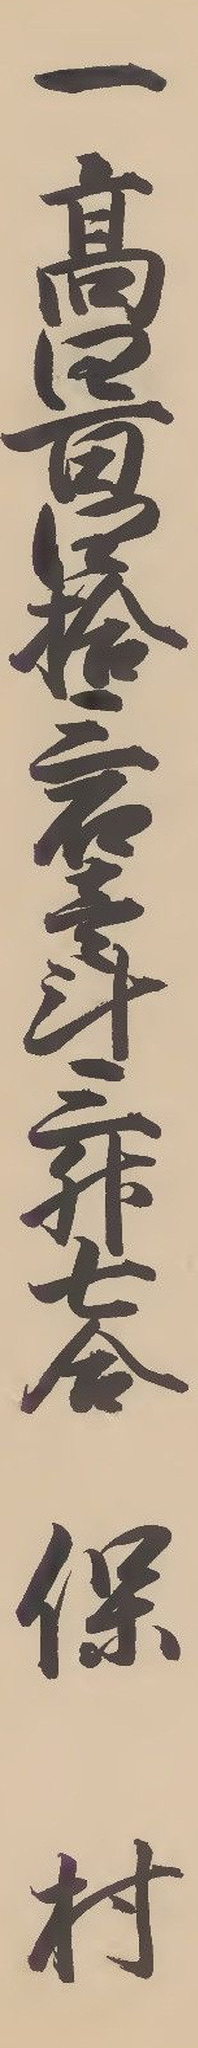一高四百四拾三石壱斗三升七合保村
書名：武蔵国郷帳　下
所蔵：国立公文書館 National Archives of Japan
